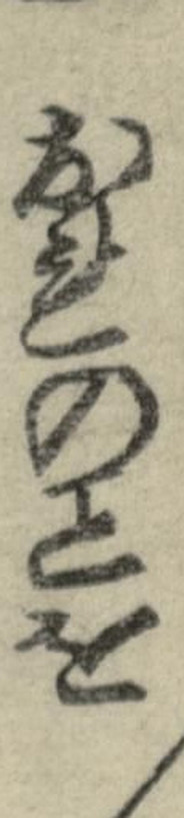おれのことを
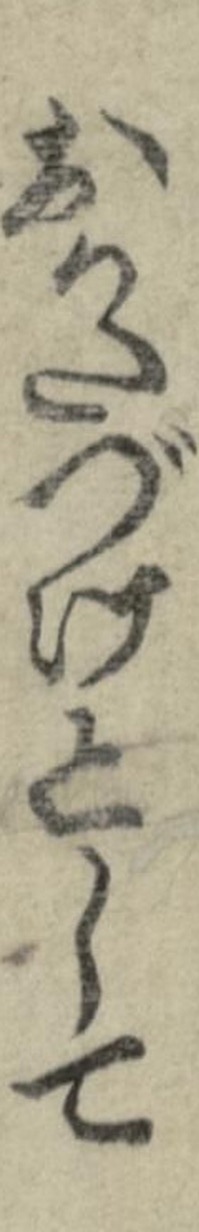おかたづけとして
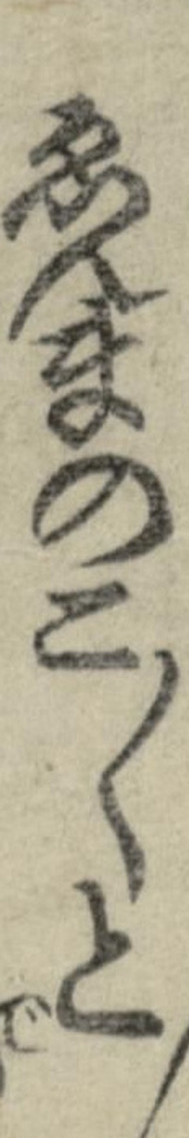ゑんまのこ〳〵と
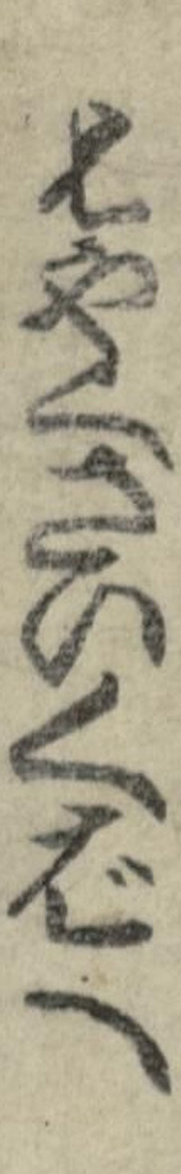はやくさいくばへ
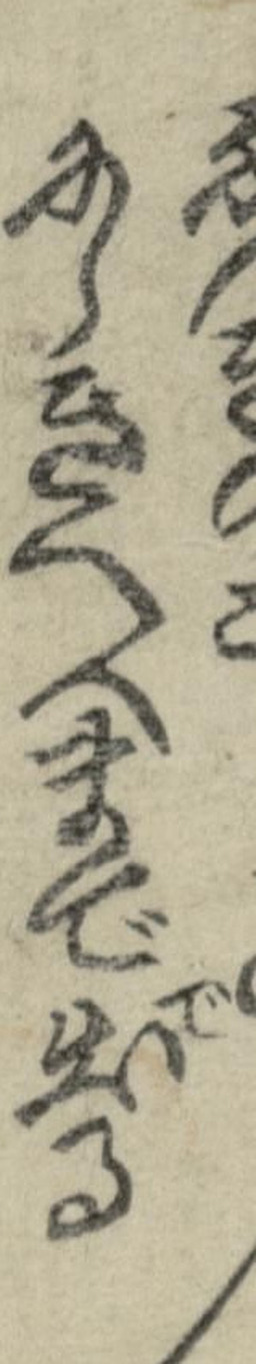にしきへへまで出る
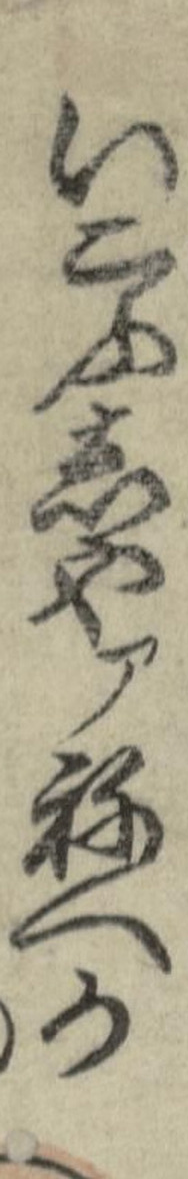いこふしやアねへか
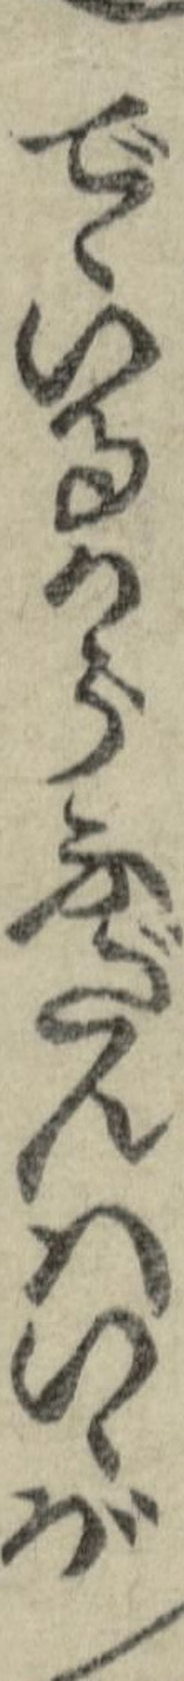でゝいるからふだんはいゝが
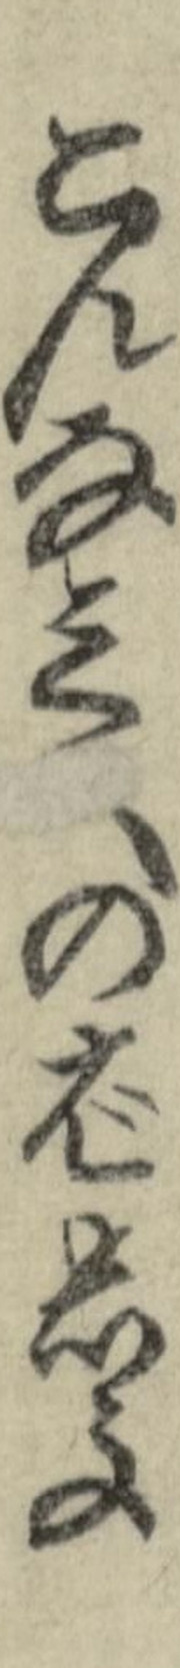こんなみへ？のばしよ
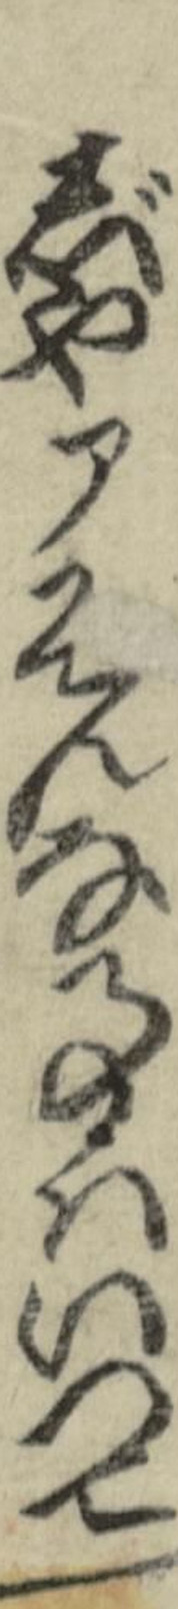じやアそんな事はいつて
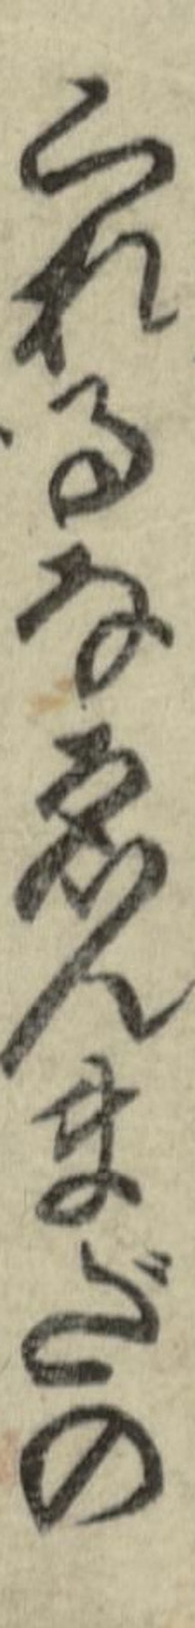くれるなゑんまだの
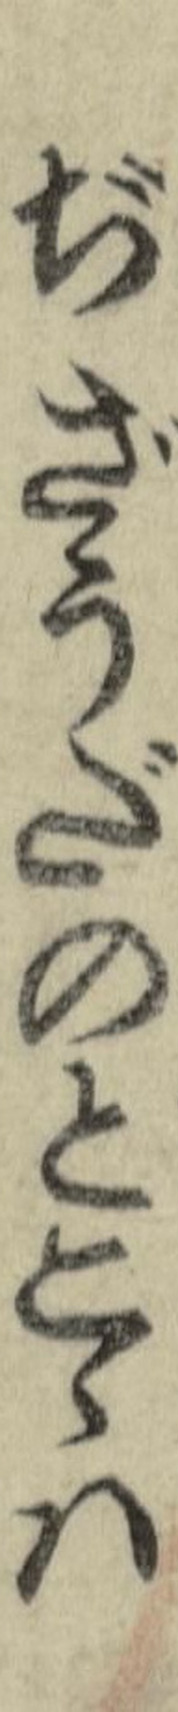ぢざうだのとこゝは
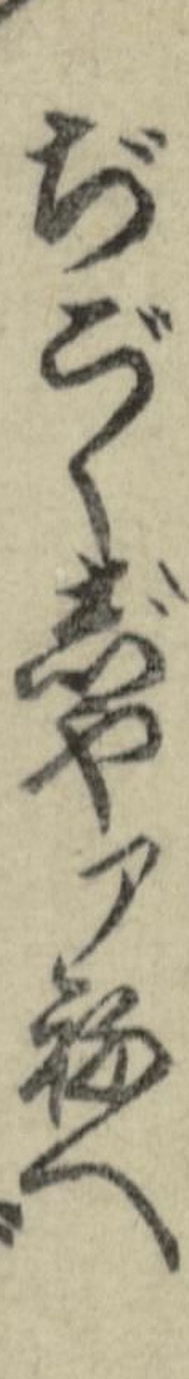ぢごくじやアねへ
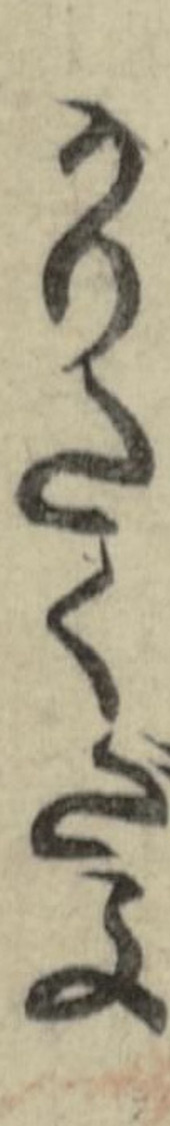かりたくだよ
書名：瓢箪
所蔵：東京大学地震研究所図書室 Earthquake Research Institute Library, The University of Tokyo, JAPAN
